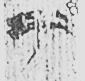于
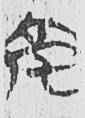京
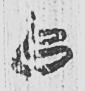𠂤
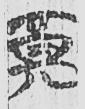奠
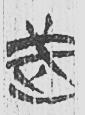武
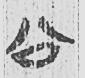公
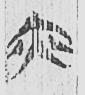亦
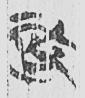政
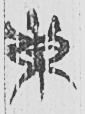東
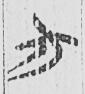方
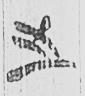之
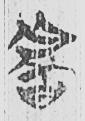者
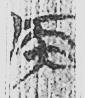侯
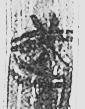武
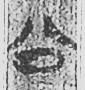公
